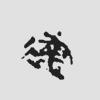失
